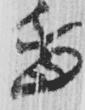眚（姓）
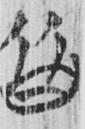皆
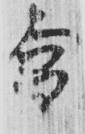○（怨）
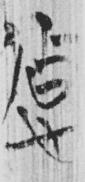○（厭）
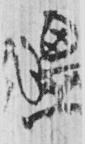○（奄）
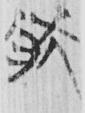○（然）
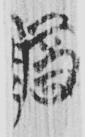𨟻（將）
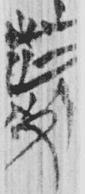○（亡）
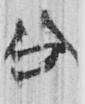公
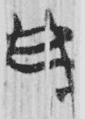弗
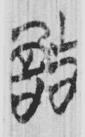詰
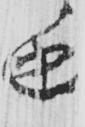臣
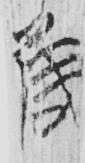唯（雖）
